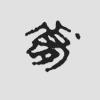夢
